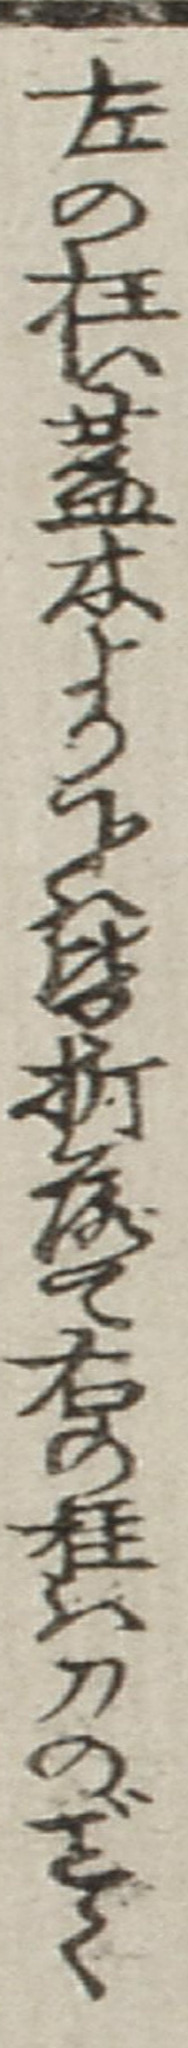左の柱は蓋木より下は皆折落て右の柱は刀のごく
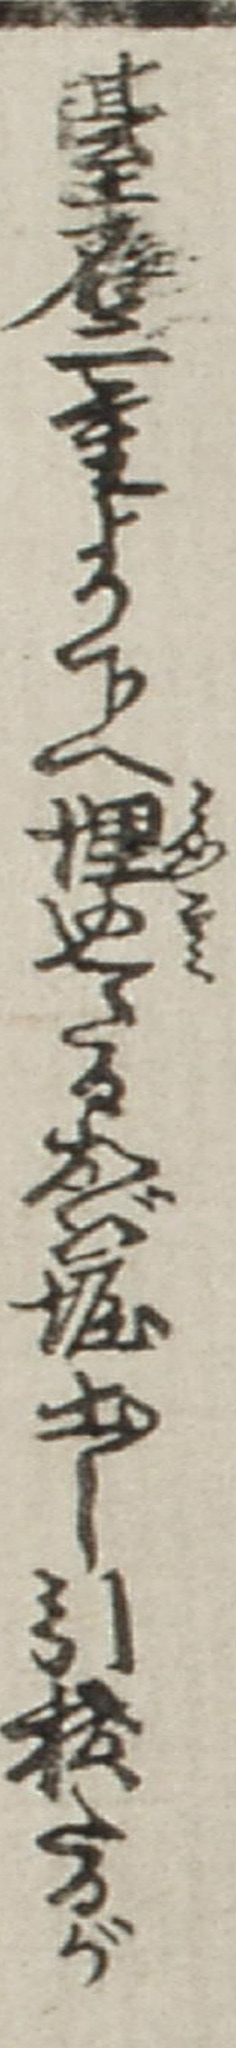台底二重より下へ埋込たるおば掘出し引抜たるが
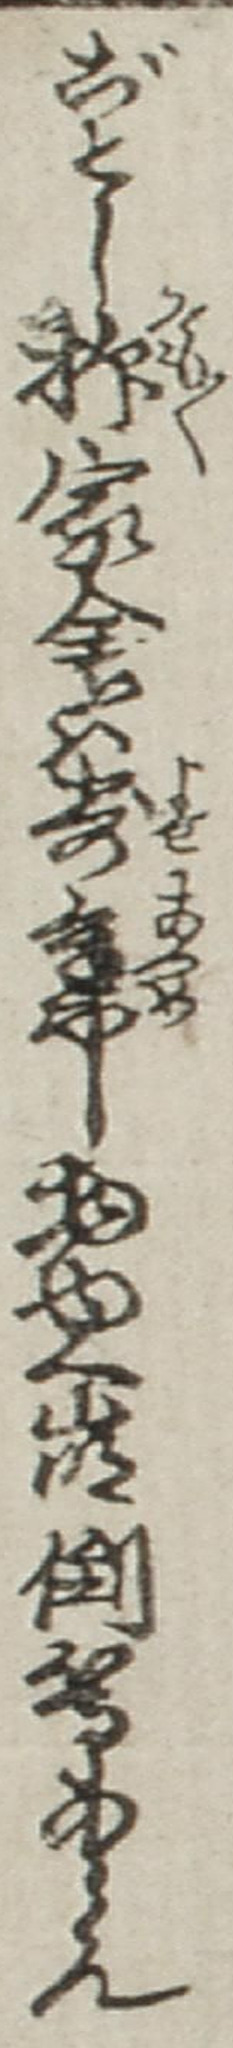ごとし抑家舎は寄彙し物ゆへ崩倒等あらん
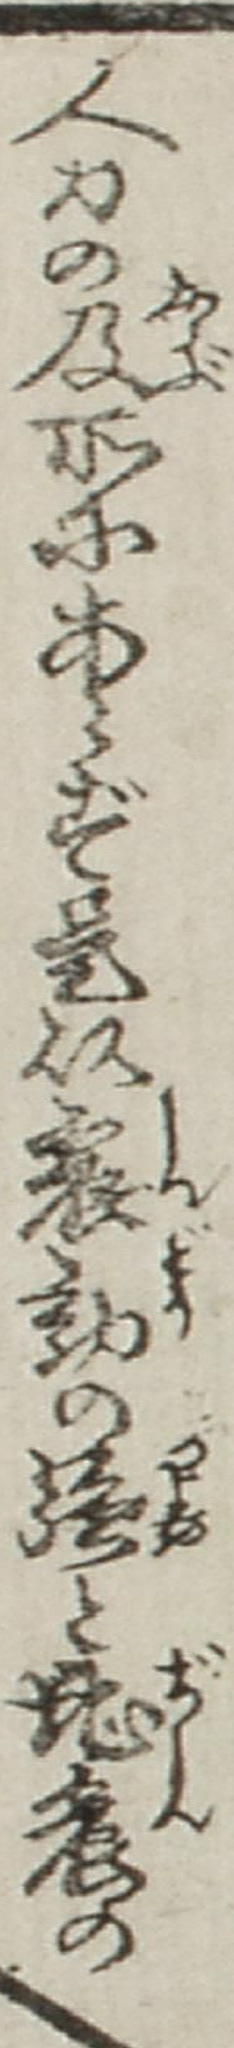人力の及所にあらず是以震動の強と地震の
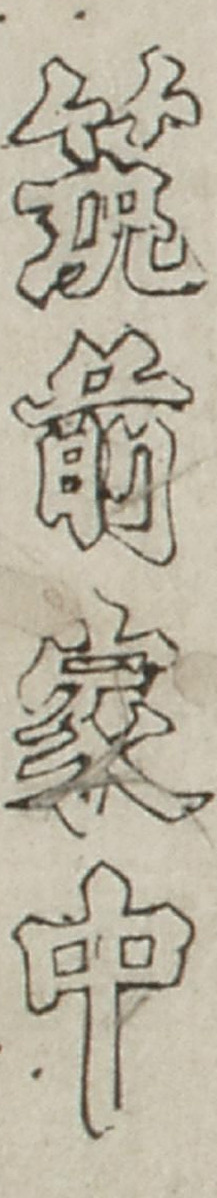筑前家中

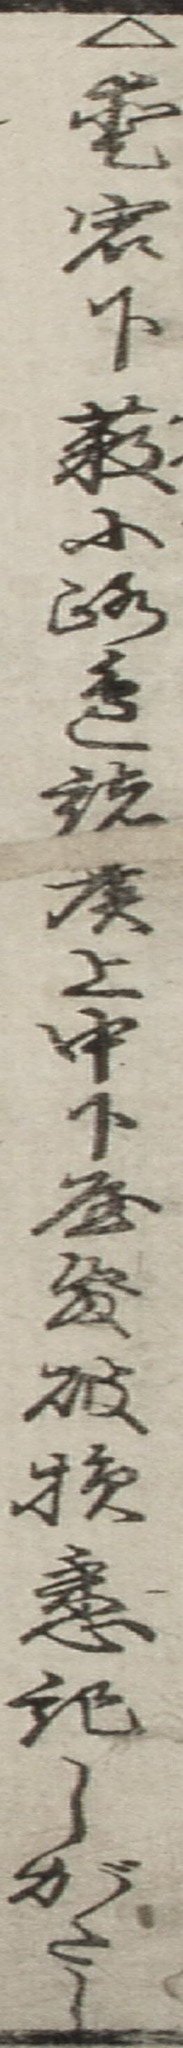△愛宕下薮小路辺諸侯上中下屋敷破損悉記しがたし
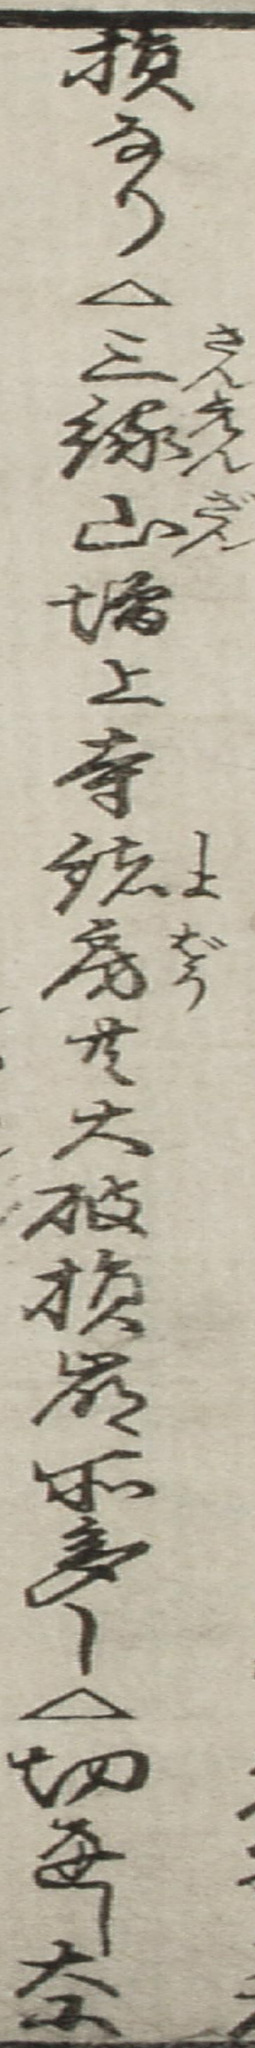損なり△三縁山増上寺諸房共大破損崩所多し△切通し大小
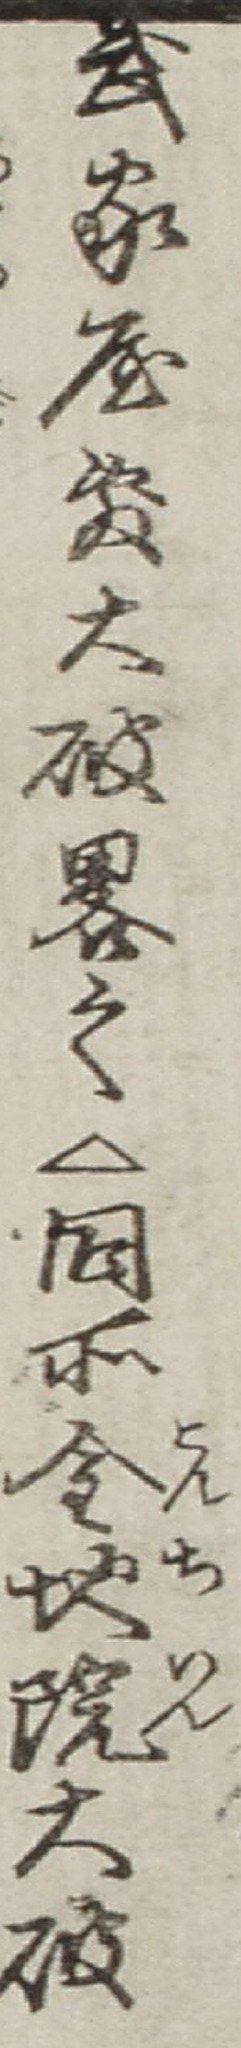武家屋敷大破略之△同所金地院大破
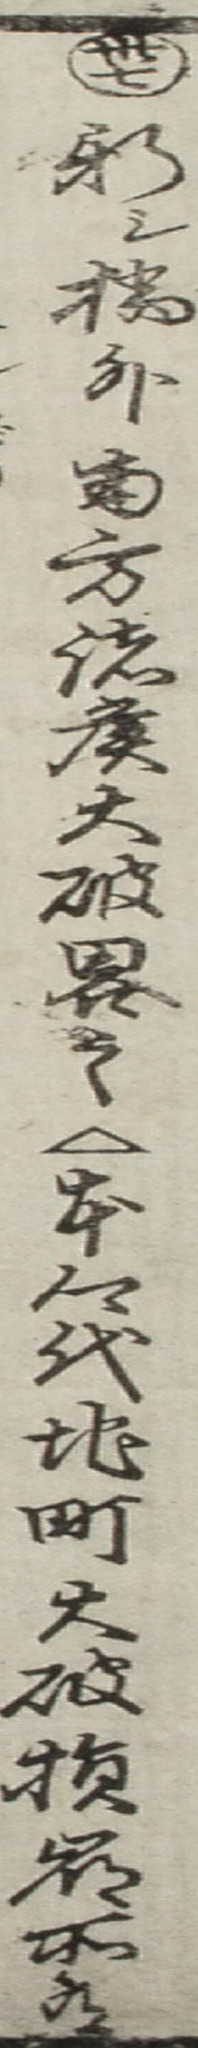新シ橋外南方緒侯大破畧之△本郷代地町大破損崩所有
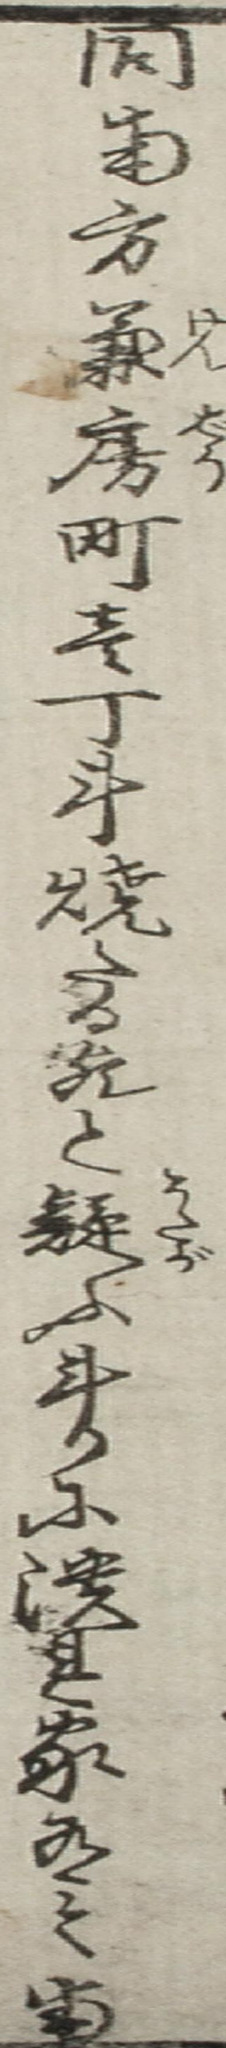同南方兼房町壱丁計焼たる歟と疑ふ計に潰家有之南
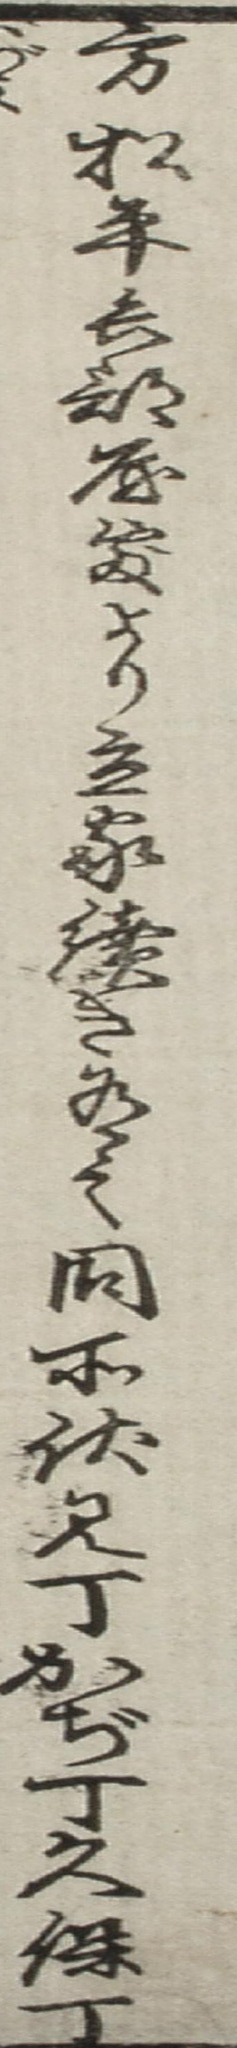方松平兵部屋敷より立家続き有之同所伏見丁かぢ丁久保丁
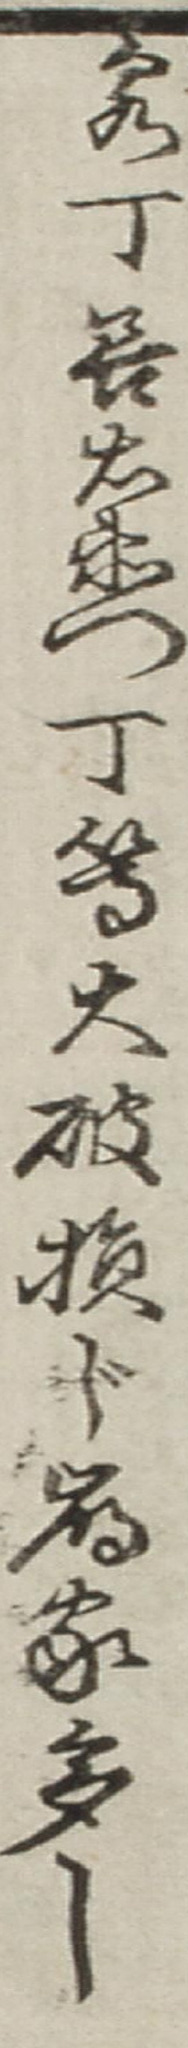泉丁善右衛門丁等大破損じ崩家多し
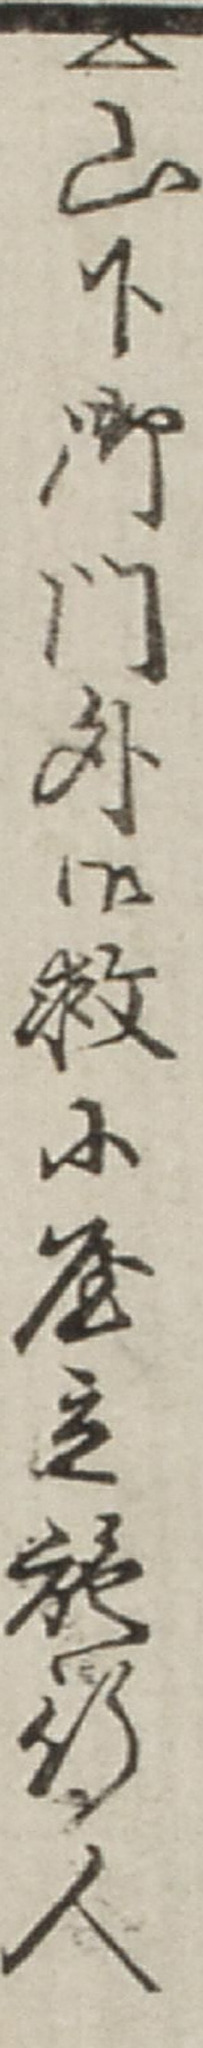△山下御門外御救小屋立施行人
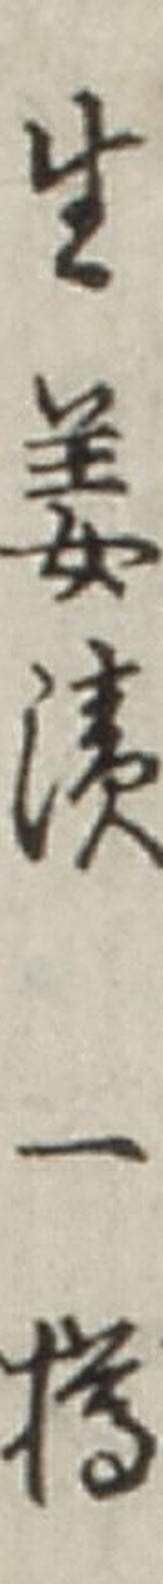生姜漬一樽
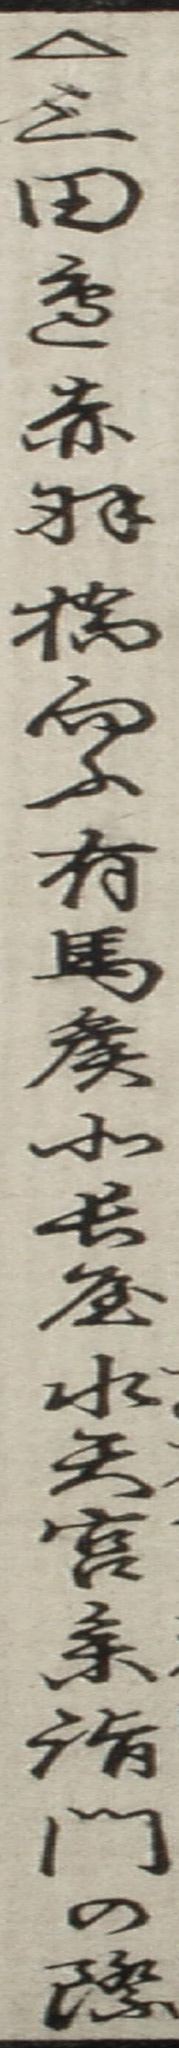△三田辺赤羽橋向ふ有馬侯北長屋水天宮参詣門の際
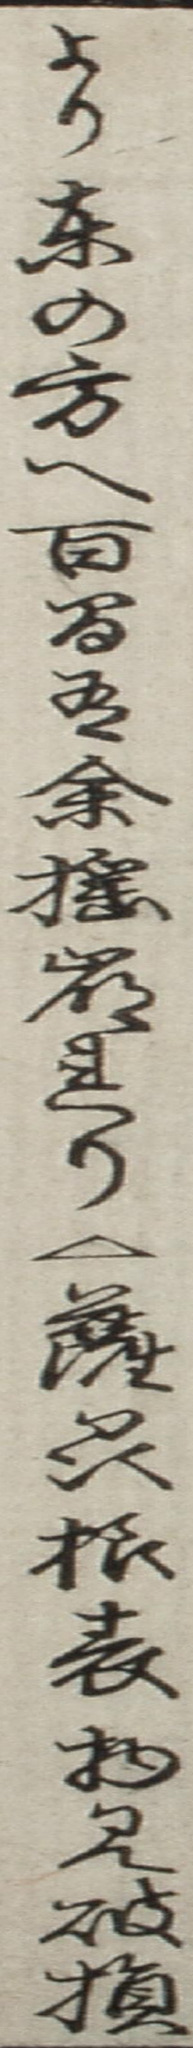より東の方へ百閒有余揺崩れり△薩州様表物見破損
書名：安政見聞誌　下
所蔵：東京大学地震研究所図書室 Earthquake Research Institute Library, The University of Tokyo, JAPAN
